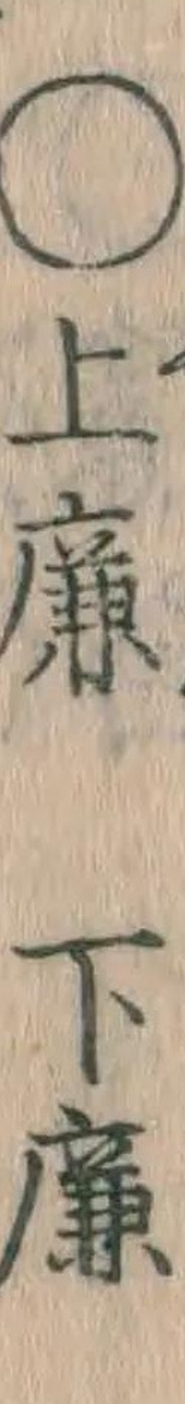○上廉下廉
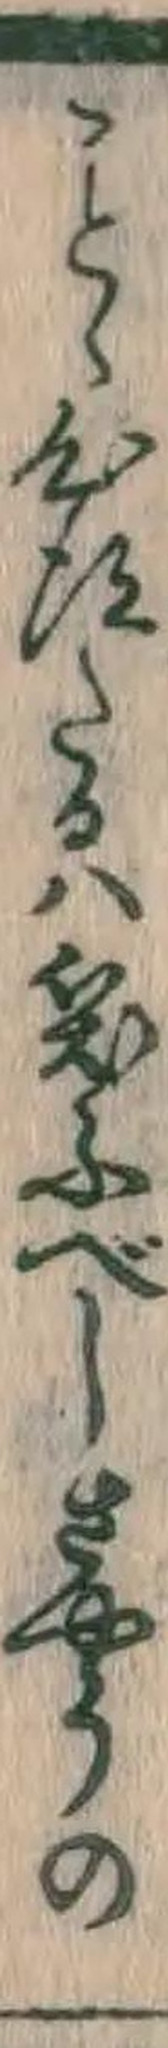ことゝ心得たるは笑ふべしさやうの
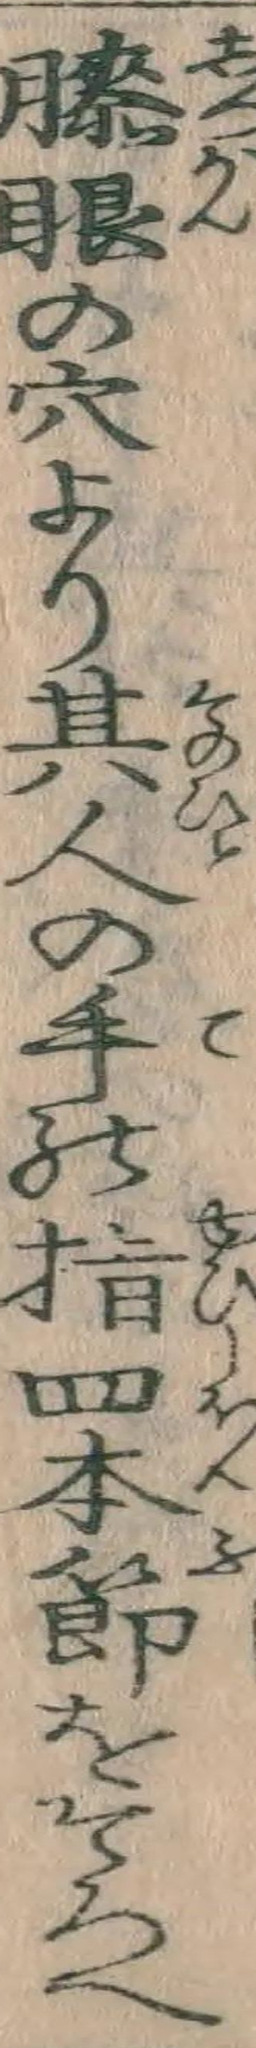膝眼の穴より其人の手の指四本節をそろへ
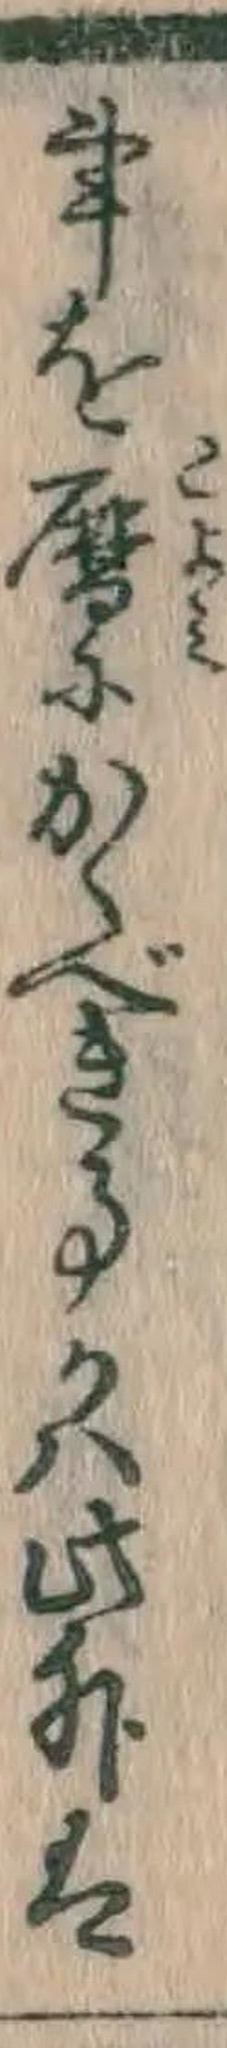事を暦にかくべき事かは此外は
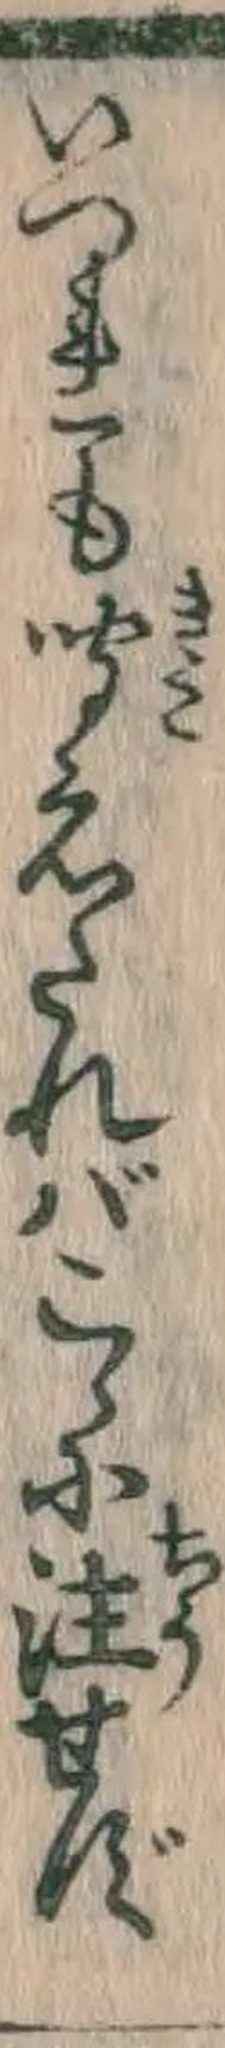いつれも聞えたればこゝに注せず
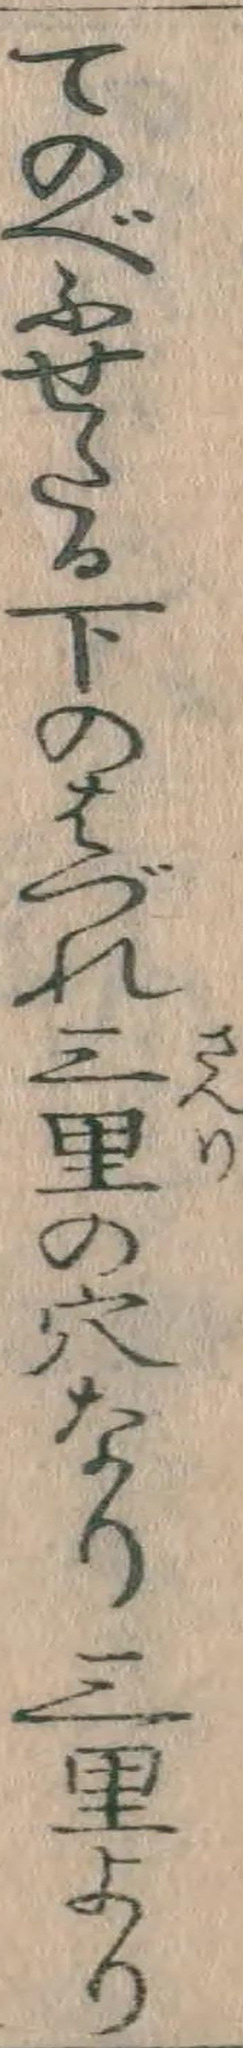てのべふせたる下のはづれ三里の穴なり三里より
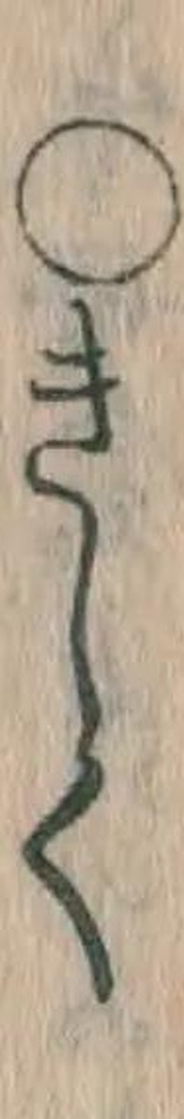○きしく
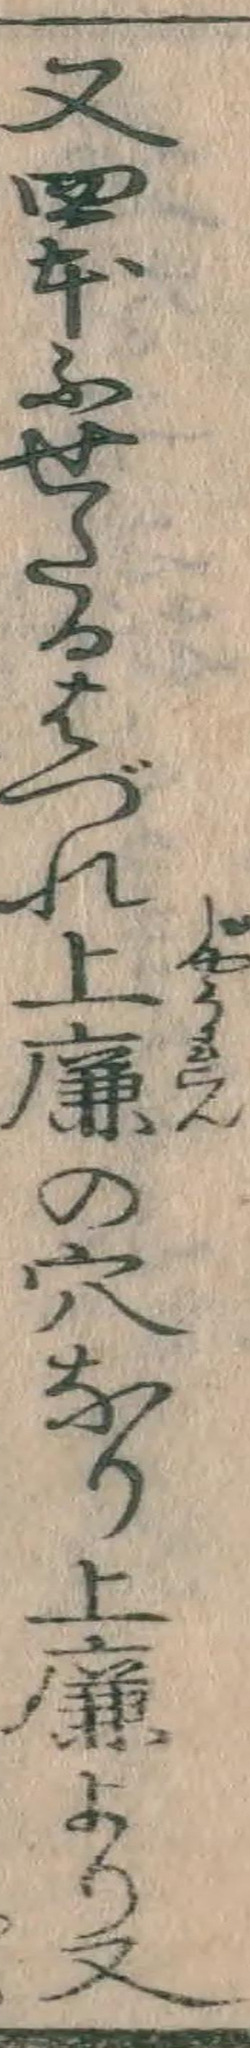又四本ふせたるはづれ上廉の穴なり上廉より又
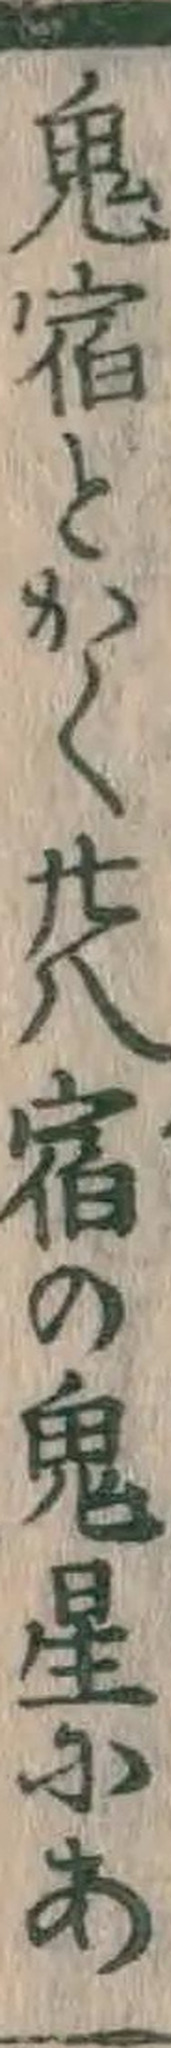鬼宿とかく廿八宿の鬼星にあ
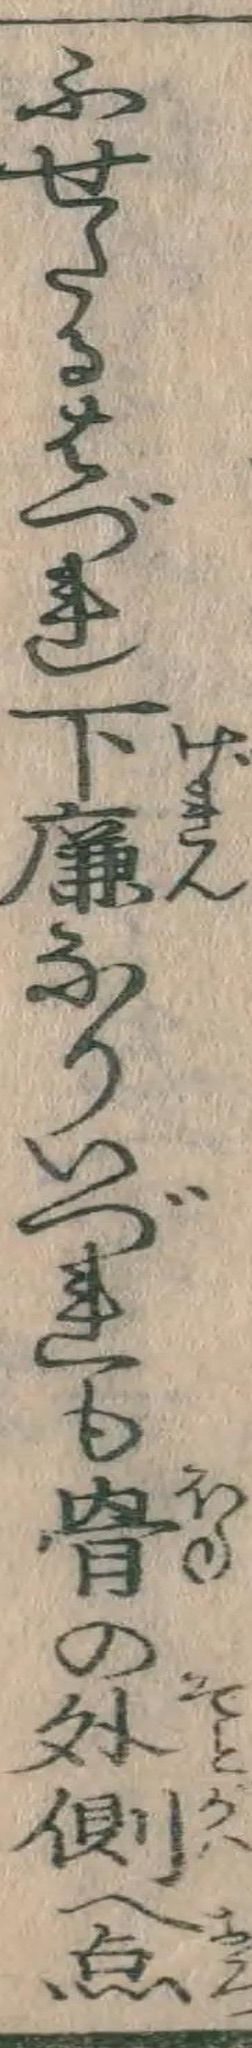ふせたるはづれ下廉なりいづれも骨の外側へ点
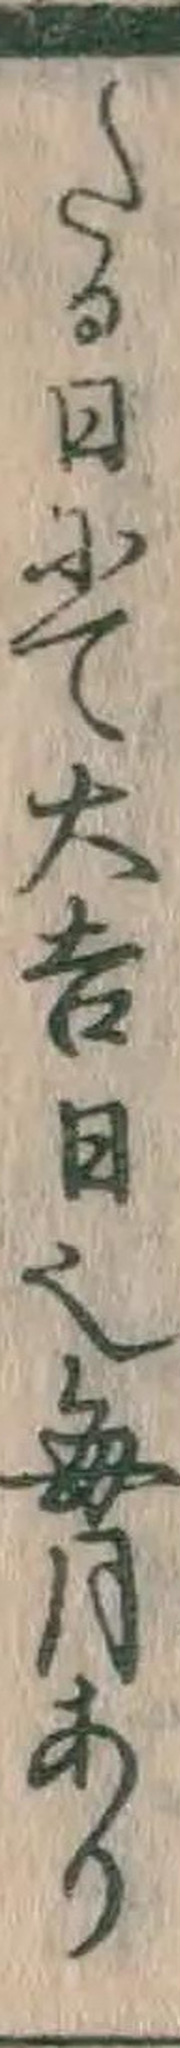たる日にて大吉日也毎月あり
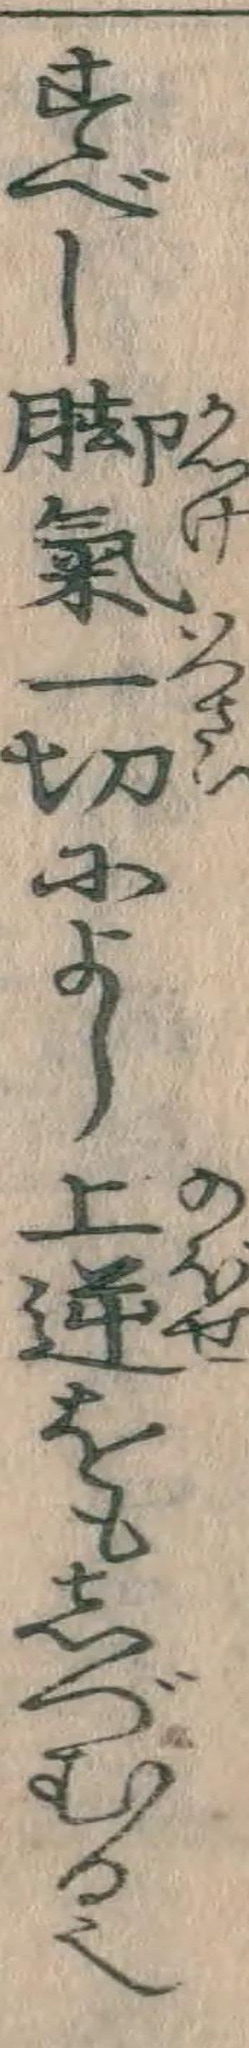すべし脚気一切によし上逆をもしづむる也
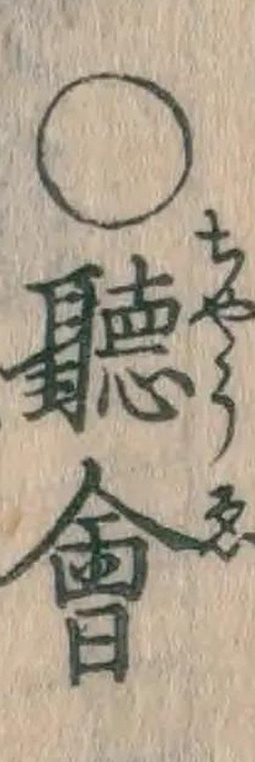○聴会
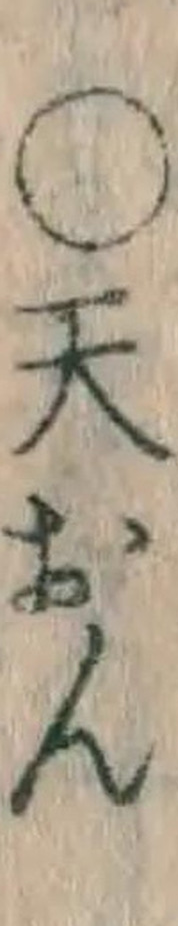○天おん
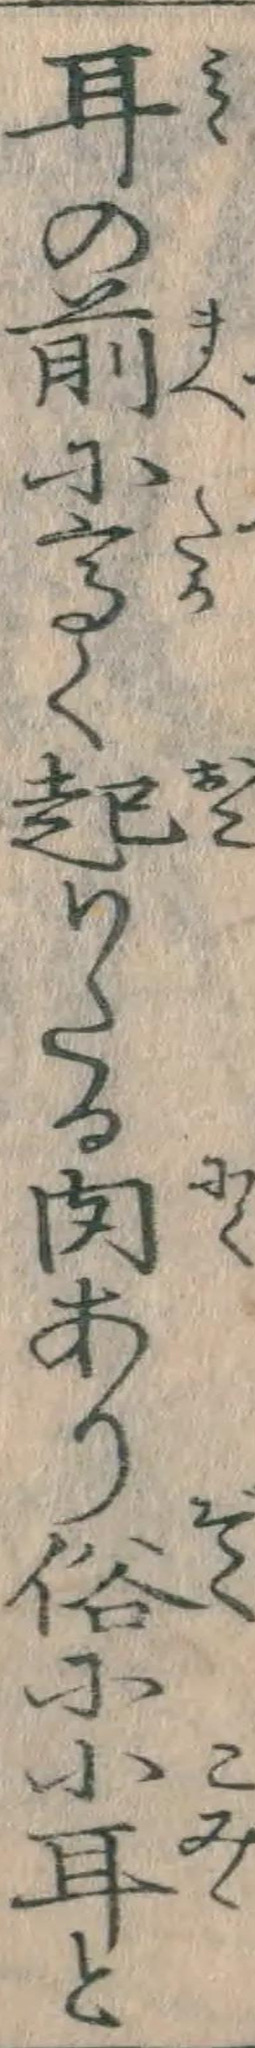耳の前に高く起りたる肉あり俗に小耳と
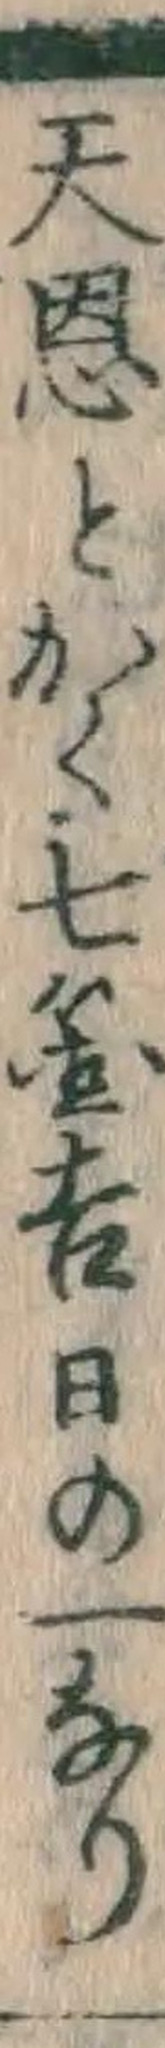天恩とかく七箇吉日の一なり
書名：広益秘事大全 3巻. [4]
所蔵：国立国会図書館 National Diet Library, JAPAN
